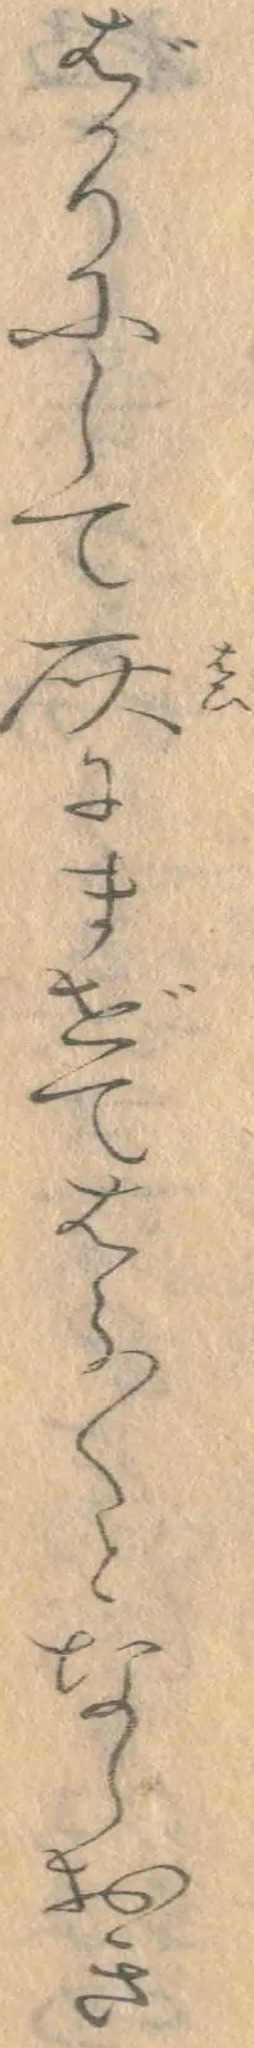ばかりにして灰にまぜてはら〳〵となしおき
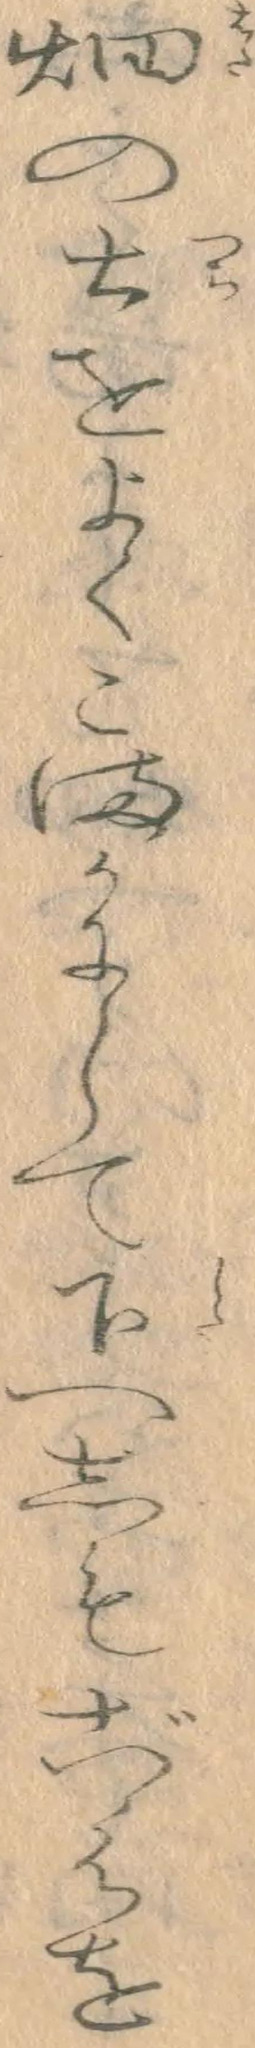畑の土をよくこまかにして下へしもごえを
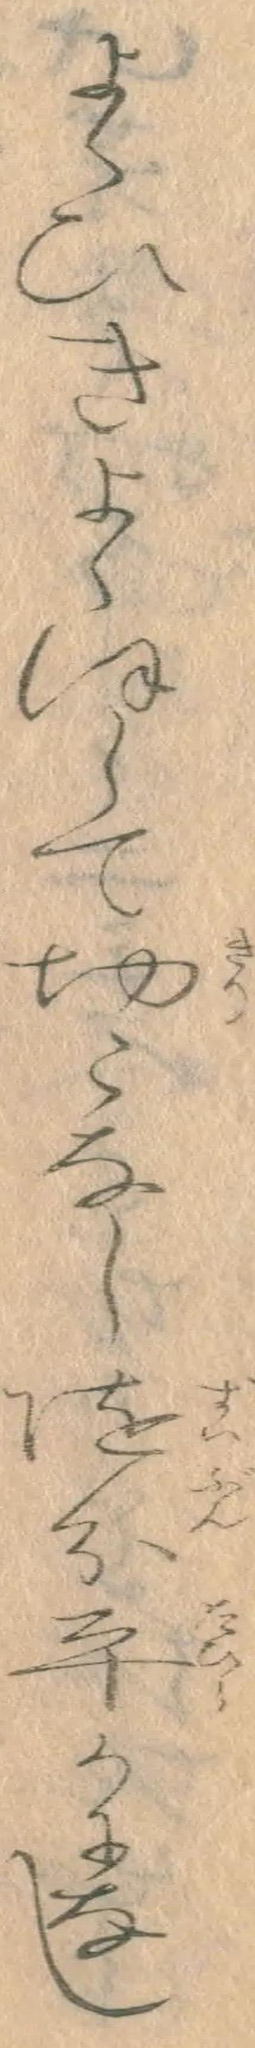よくひきよくほして切こなし随分平かになし
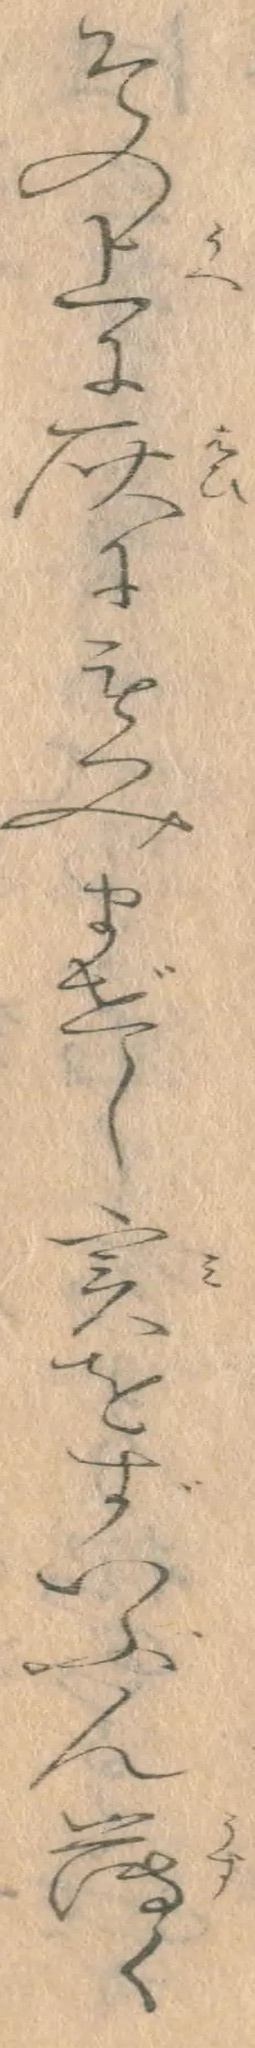その上に灰にもみまぜし実をずいぶん薄く
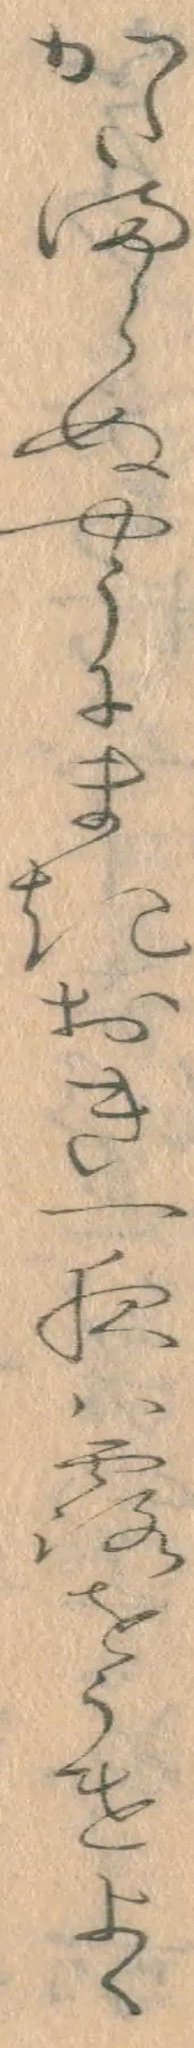かたまらぬやうにまきおき一夜は露をうけよく
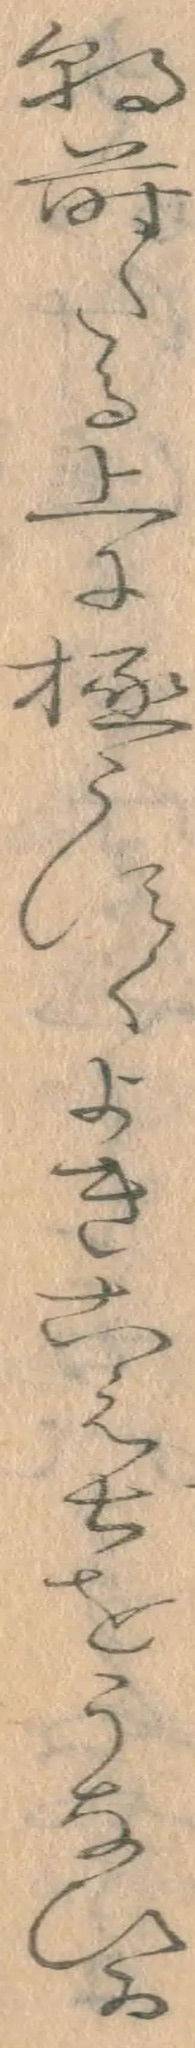朝蒔たる上に極うすくよきこえ土をうなひて
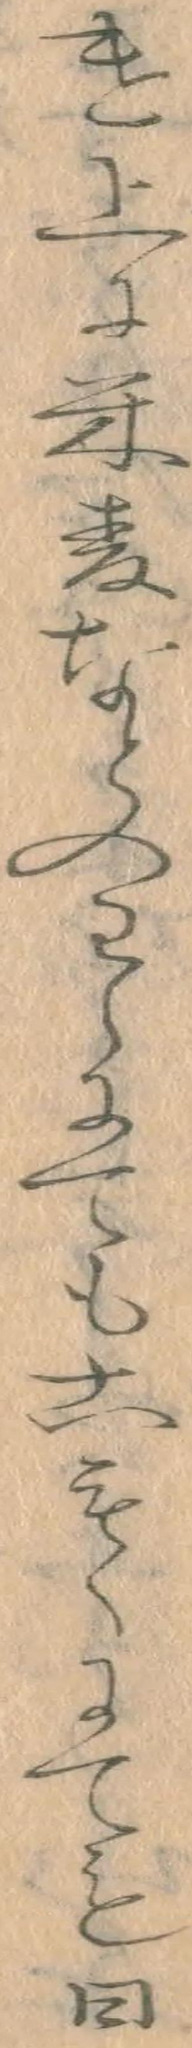遣上に米麦なとのわらにてもごもくにても日
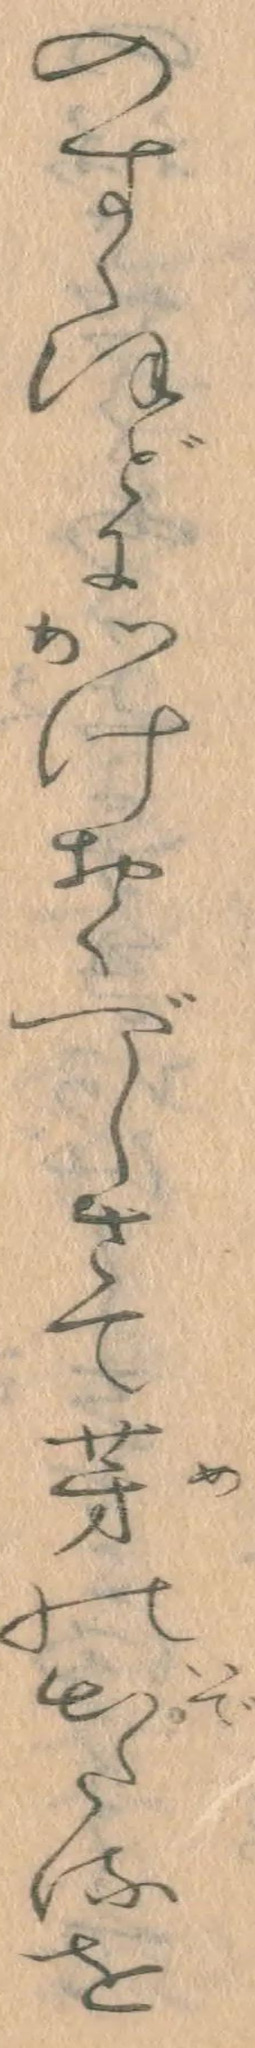のすくほどにかけおくべしさて芽の出たるを
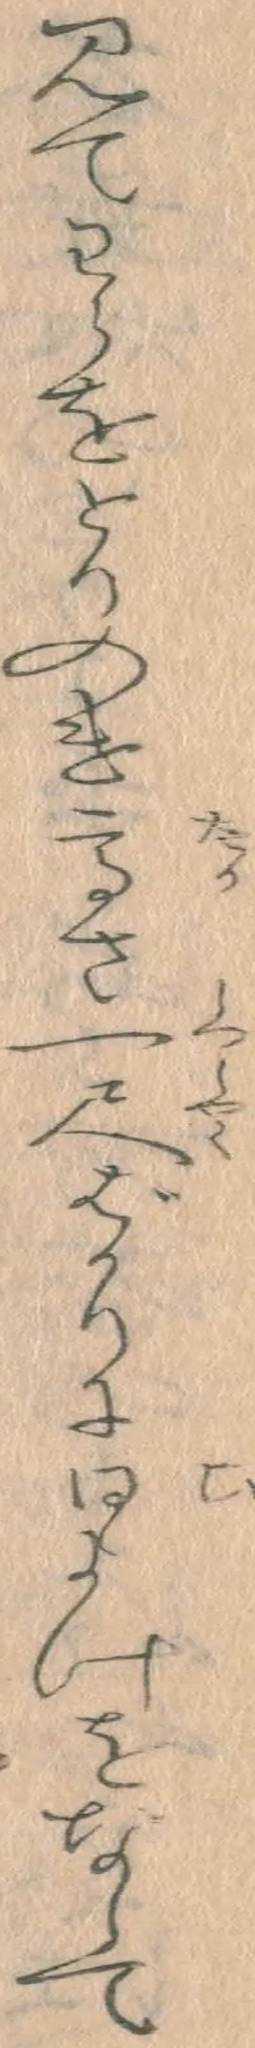見てわらをとりのけ高さ一尺ばかりに日よけをなして
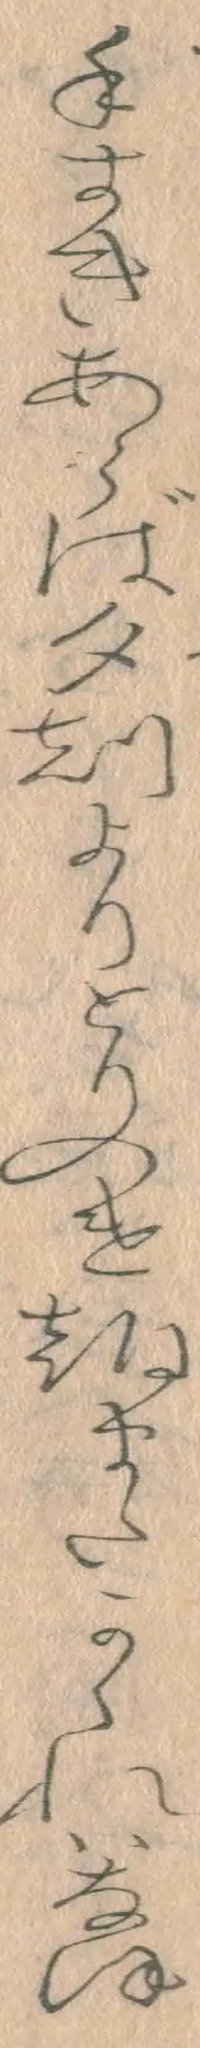手すきあらば夕刻よりとりのけ朝まきかくれはなほ
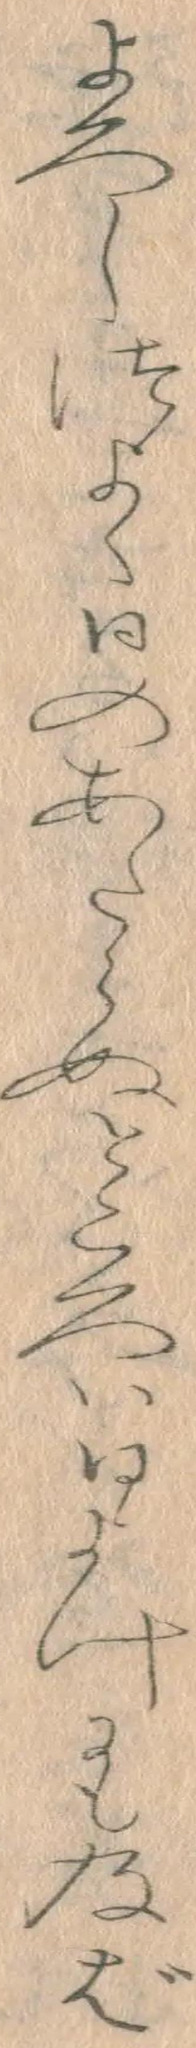よろしつよく日のあたらぬところは日よけにも及ば
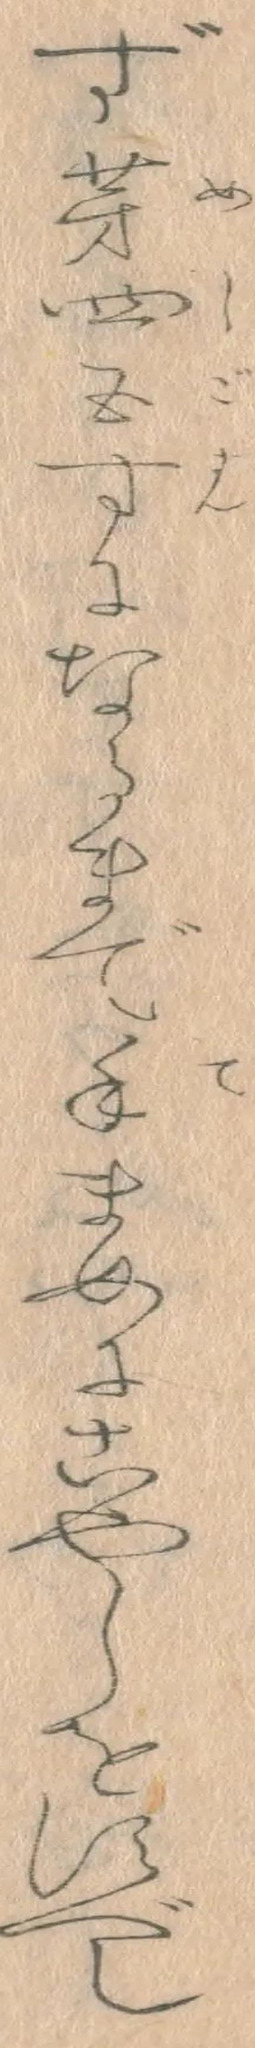ず芽四五寸になるまで手まめにこやしをすべし
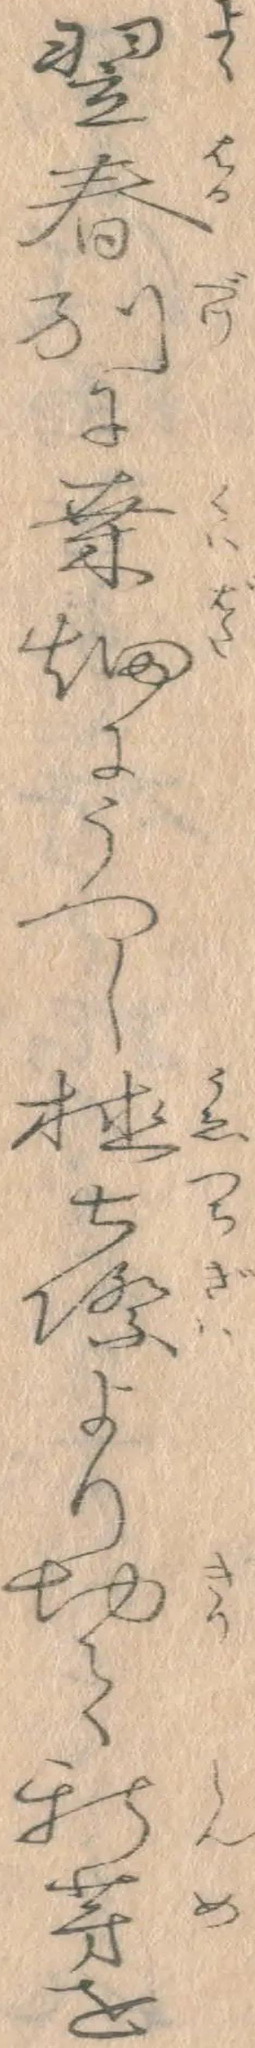翌春別にく別に桑畑にうつし植土際より切て新芽を
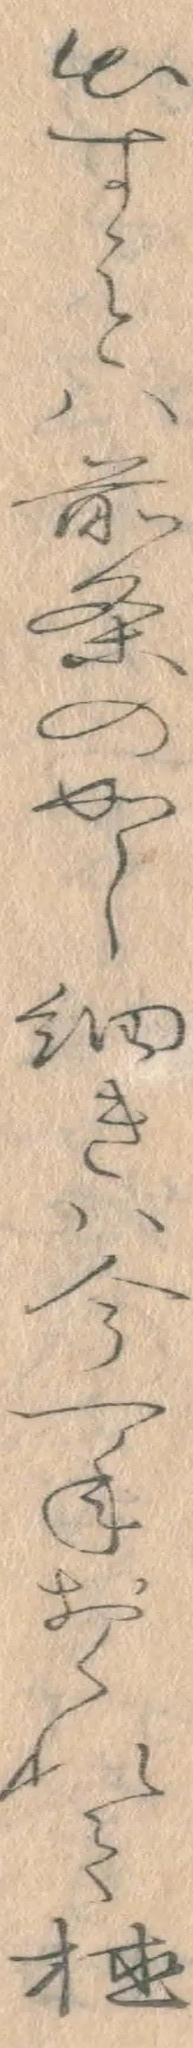出すとは前条の如し細きは今一年おくれて植
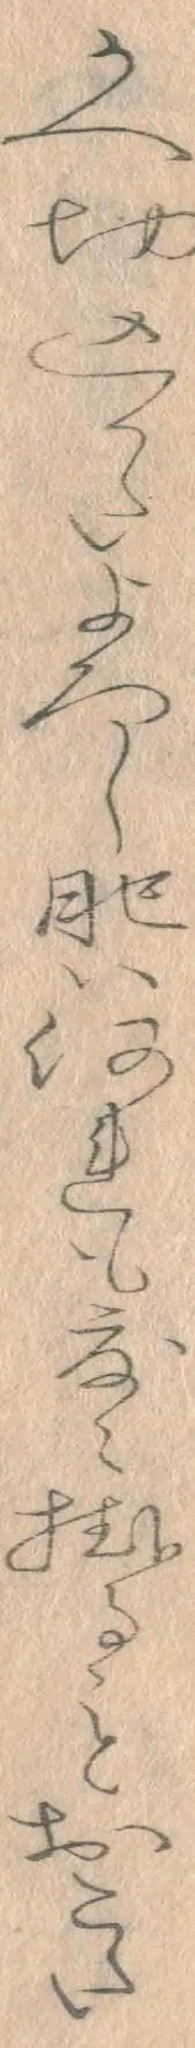かへ切込かたよろし肥は何れも度々掛ることおこた
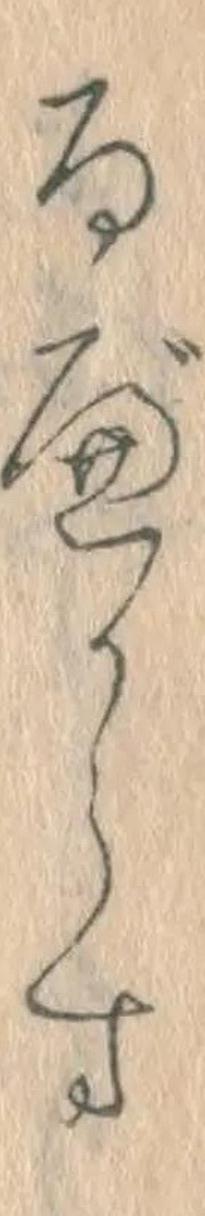るべからす
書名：蚕茶并紙木植方書
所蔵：国立国会図書館 National Diet Library, JAPAN
